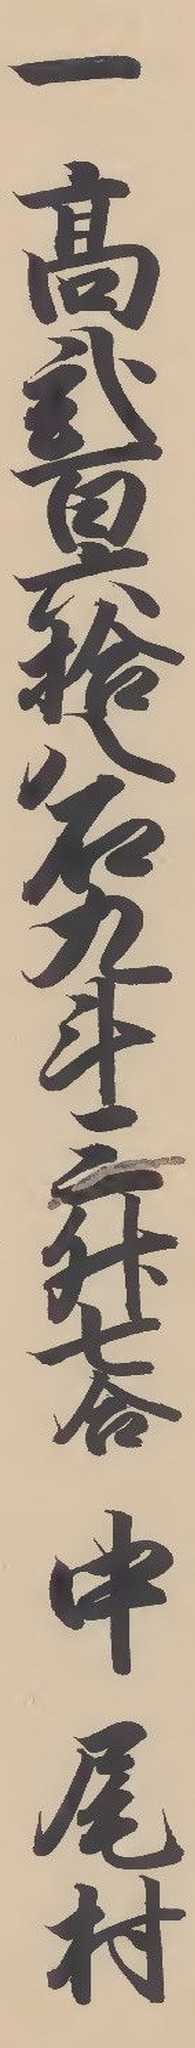一高弐百六拾八石九斗三升七合中尾村

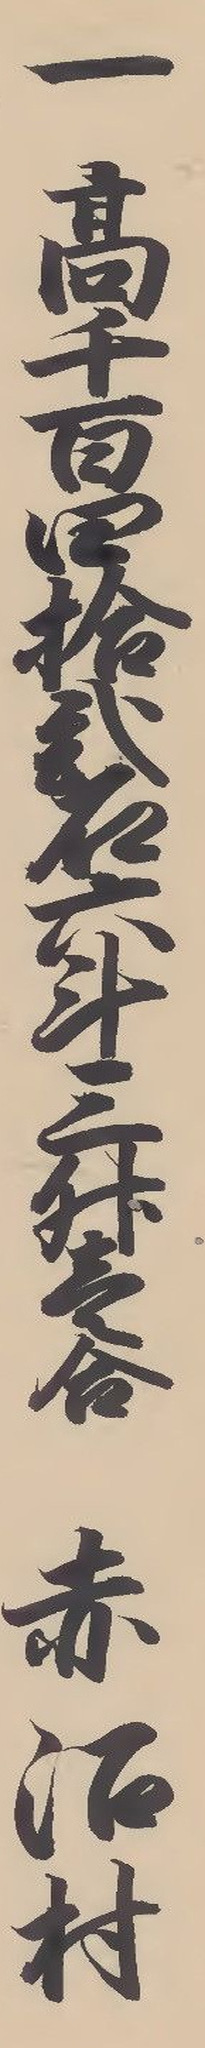一高千百四拾弐石六斗三升壱合赤沼村
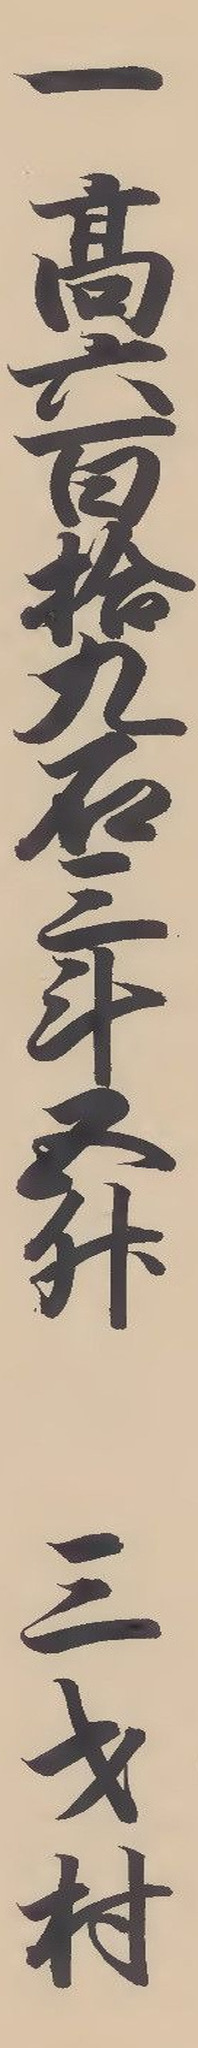一高六百拾九石三斗五升三才村
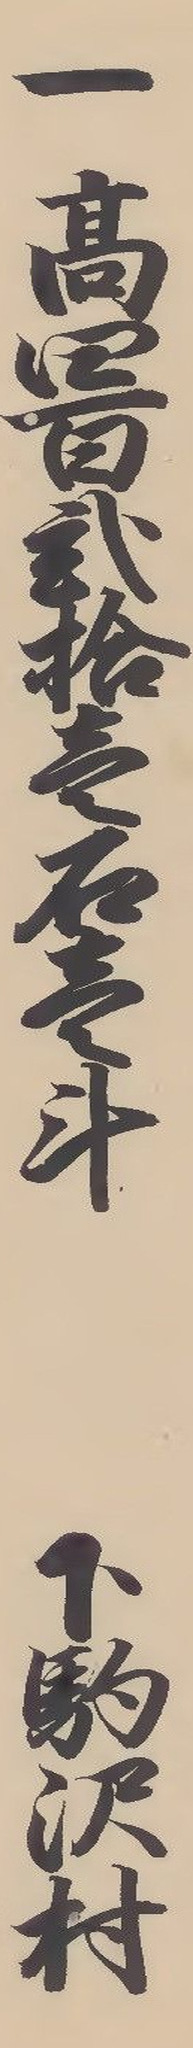一高四百弐拾壱石壱斗下駒沢村
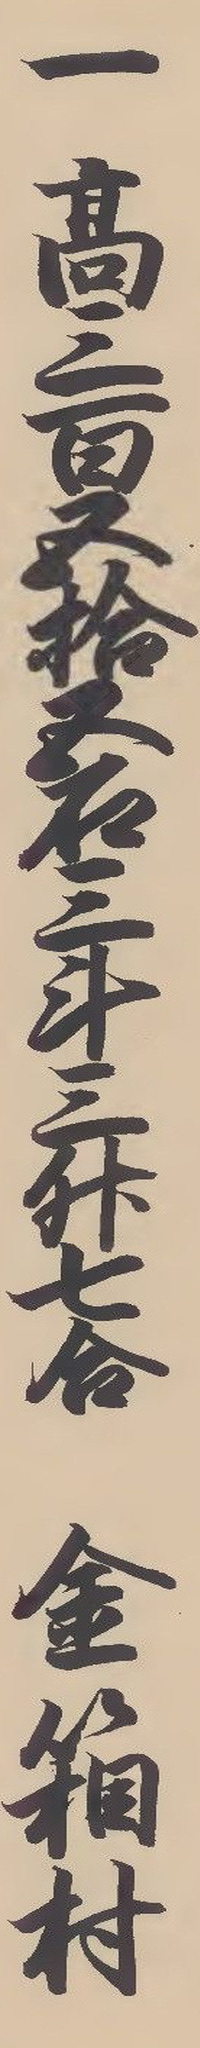一高三百五拾五石三斗三升七合金箱村
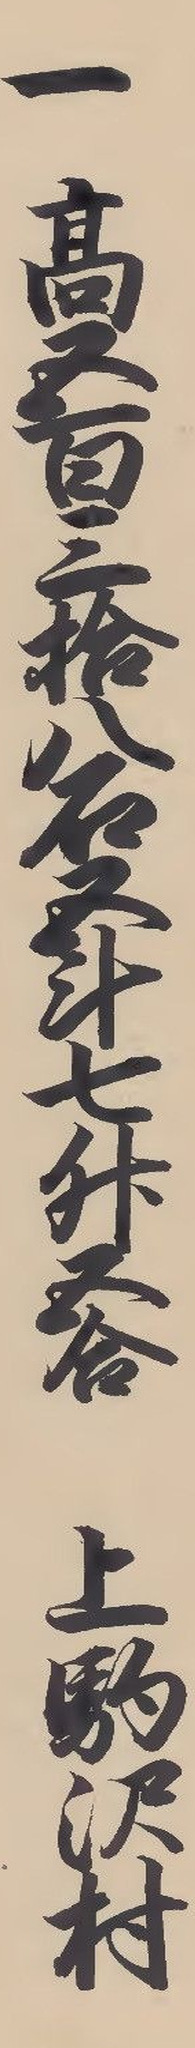一高五百三拾八石五斗七升五合上駒沢村
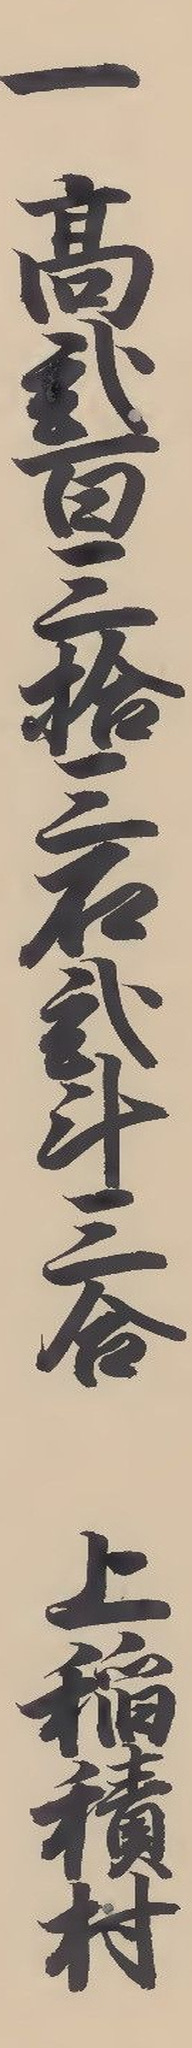一高弐百三拾三石弐斗三合上稲積村
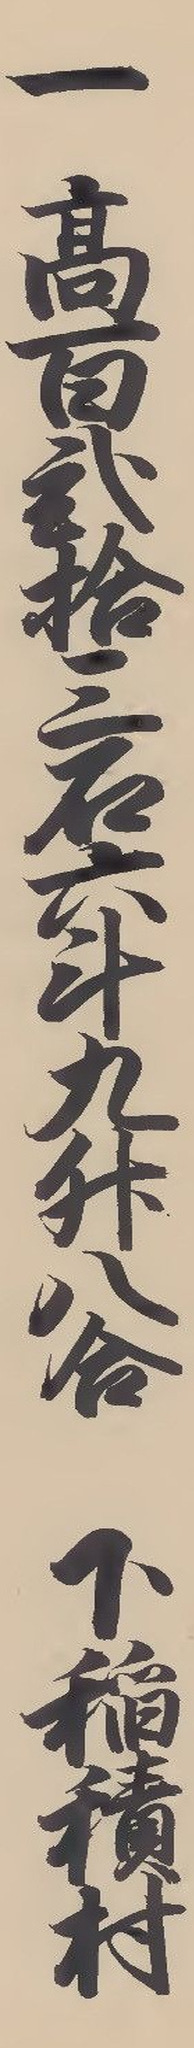一高百弐拾三石六斗九升八合下稲積村
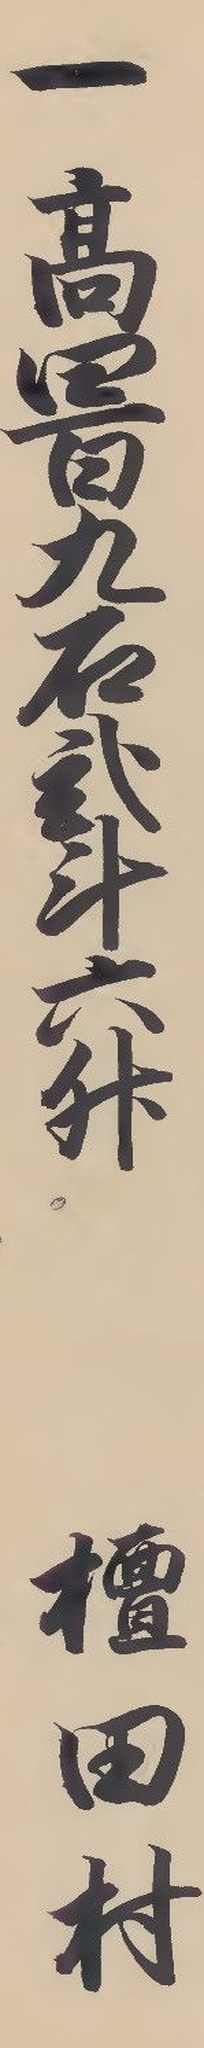一高四百九石弐斗六升檀田村

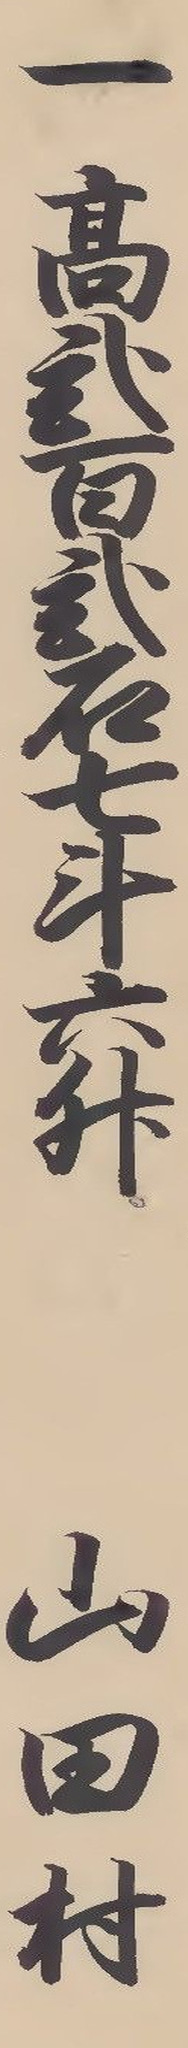一高弐百弐石七斗六升山田村
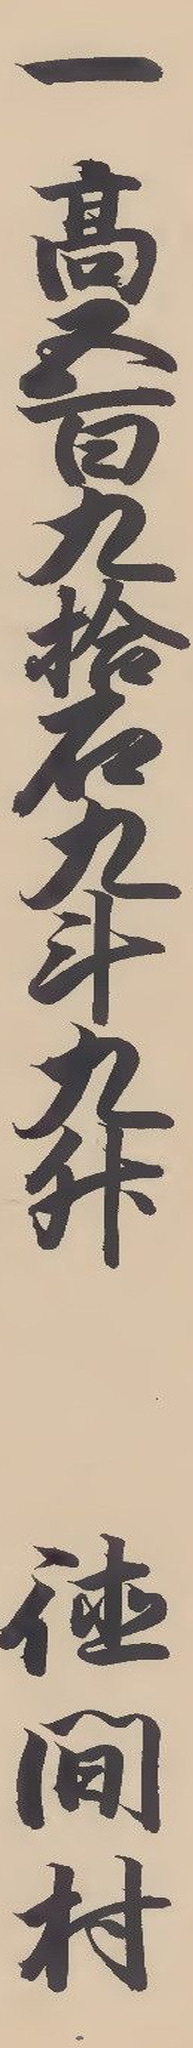一高五百九拾石九斗九升徳間村
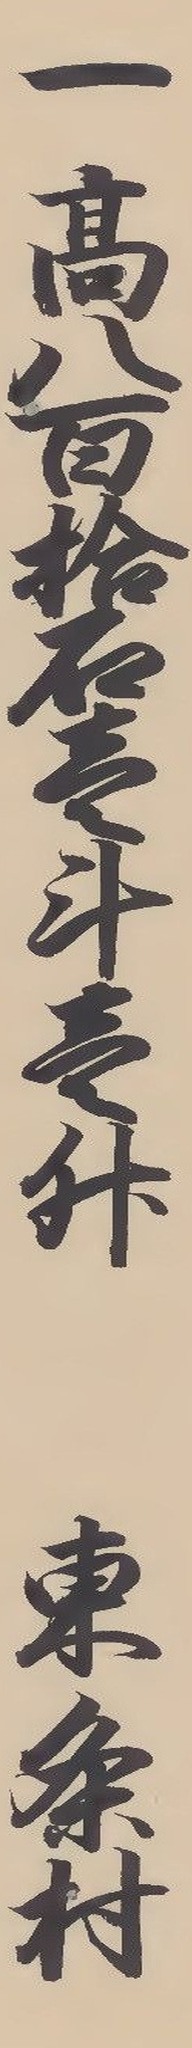一高八百拾石壱斗壱升東条村
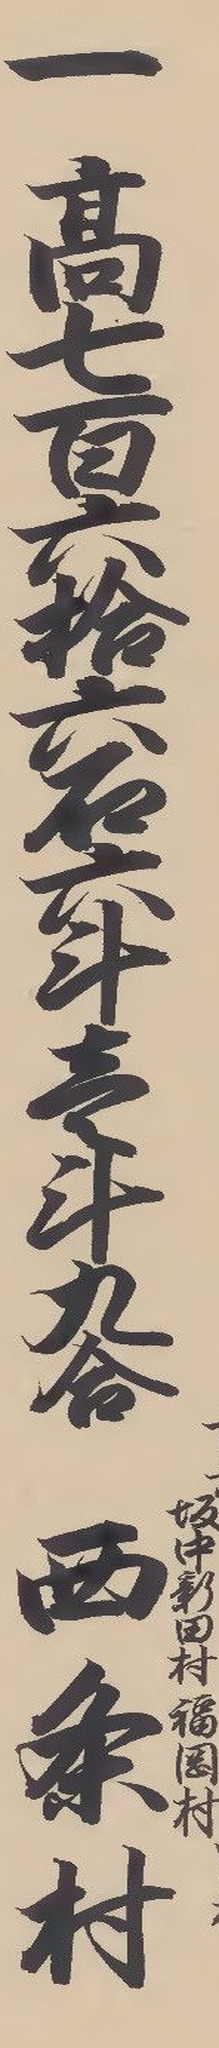一高七百六拾六石六斗壱斗九合西条村
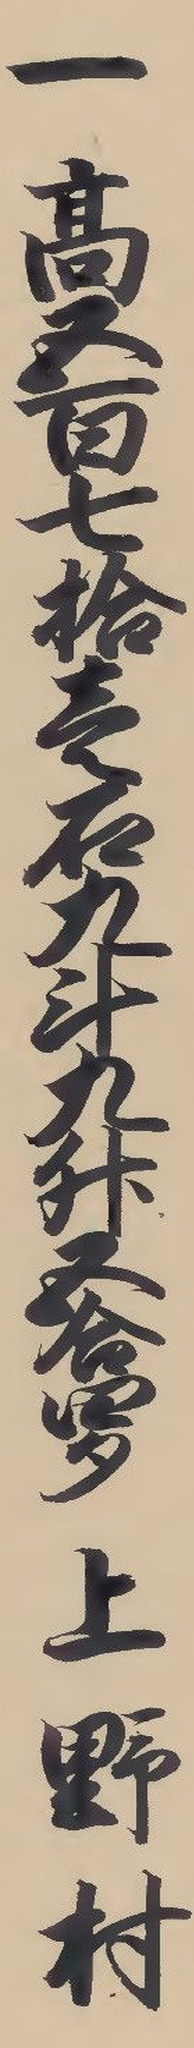一高五百七拾壱石九斗九升五合四勺上野村
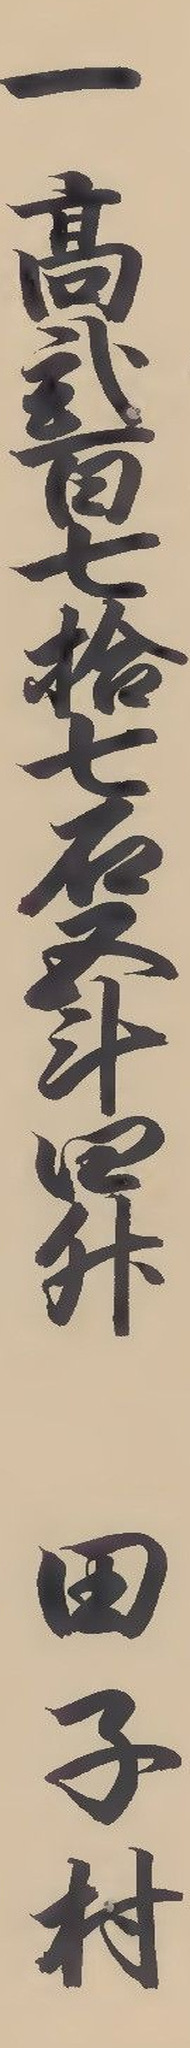一高弐百七拾七石五斗四升田子村
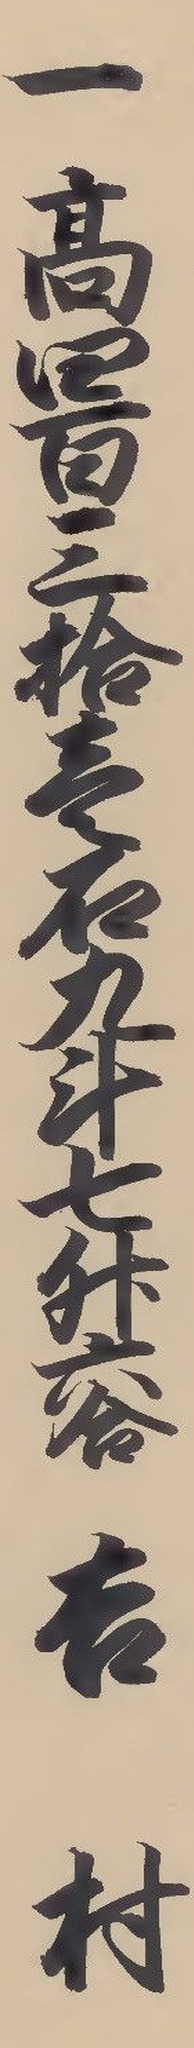一高四百三拾壱石九斗七升六合吉村
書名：信濃国郷帳
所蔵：国立公文書館 National Archives of Japan
